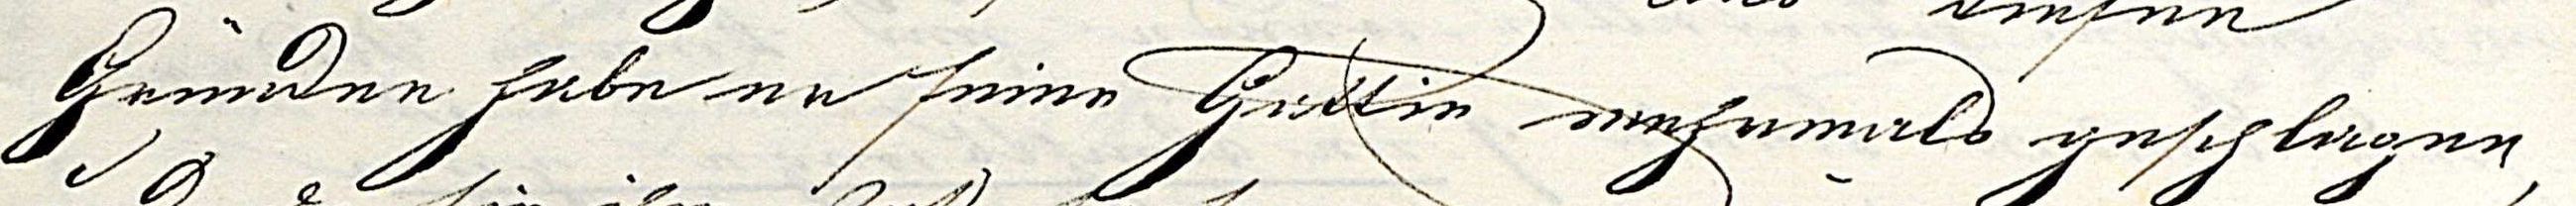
Gründen habe er seine Gattin mehrmals geschlagen,
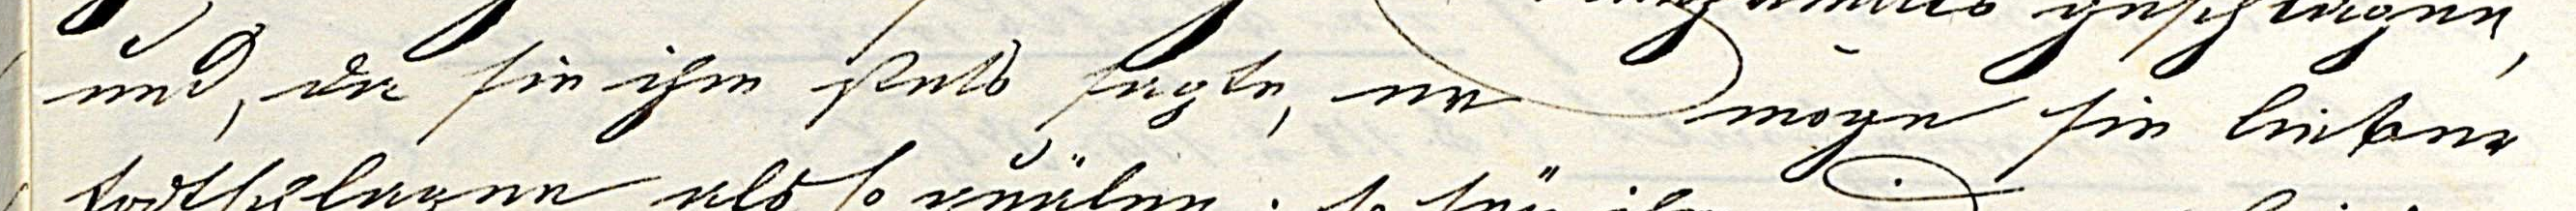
und da sie ihm stets sagte, er möge sie lieber
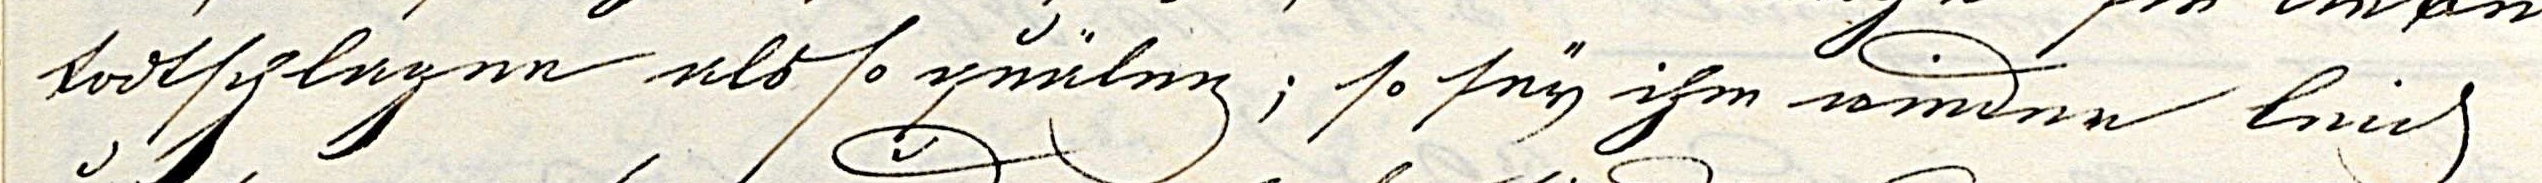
todtschlagen als so quälen; so sey ihm wieder leid
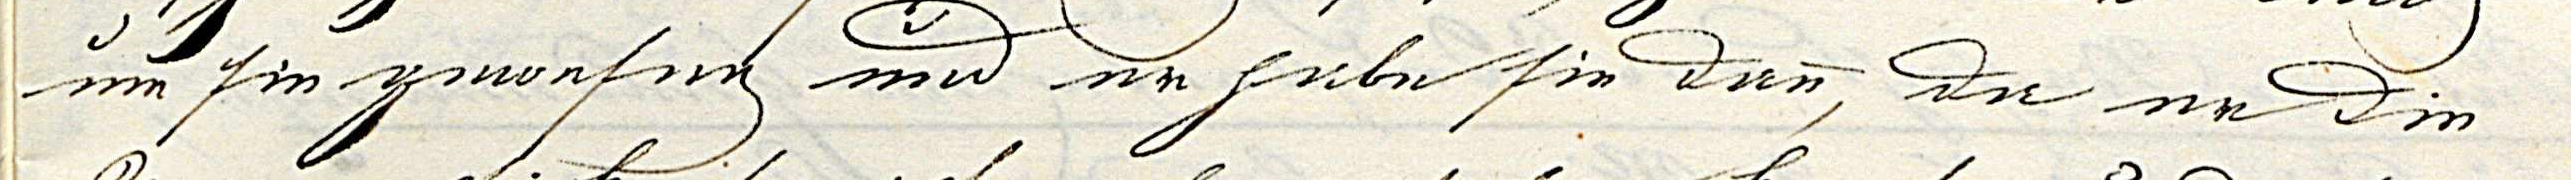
um sie gewesen und er habe sie dann, da er die
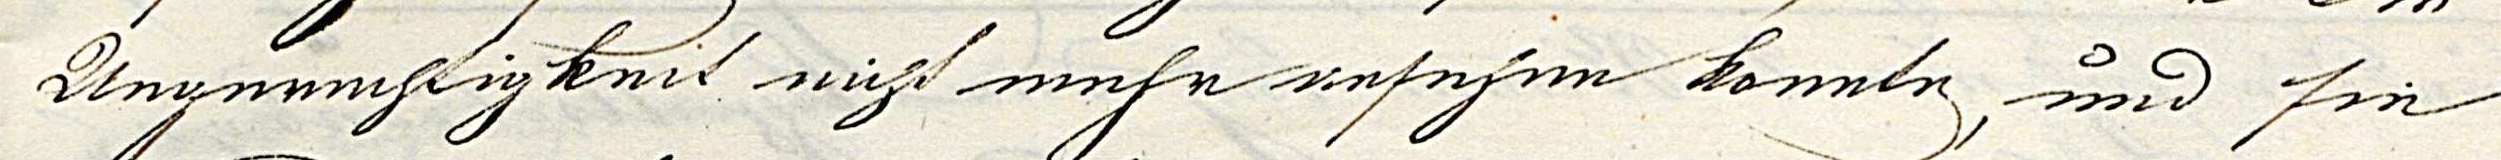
Ungerechtigkeit nicht mehr ansehen konnte, und sie
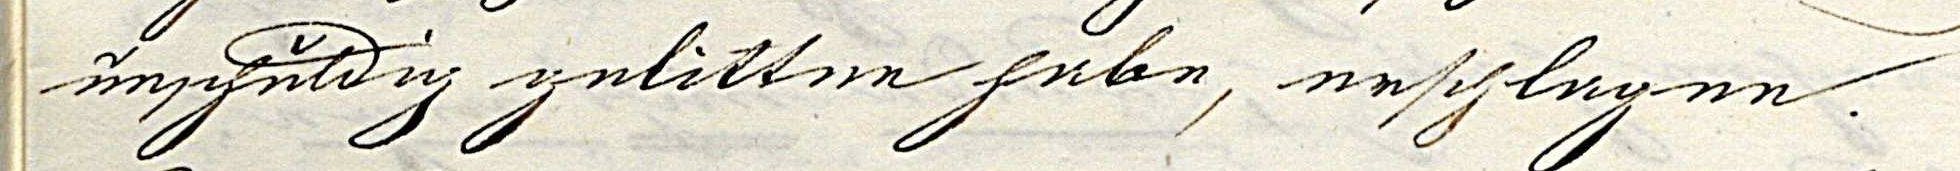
unschuldig gelitten habe, erschlagen.
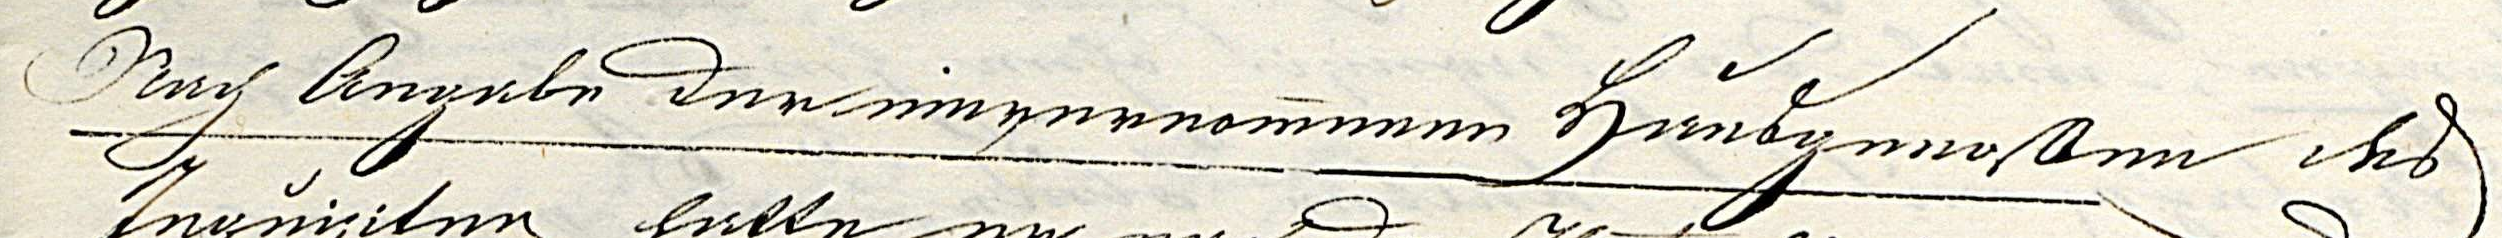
Nach Angabe der einvernommene Hausgenoßen des
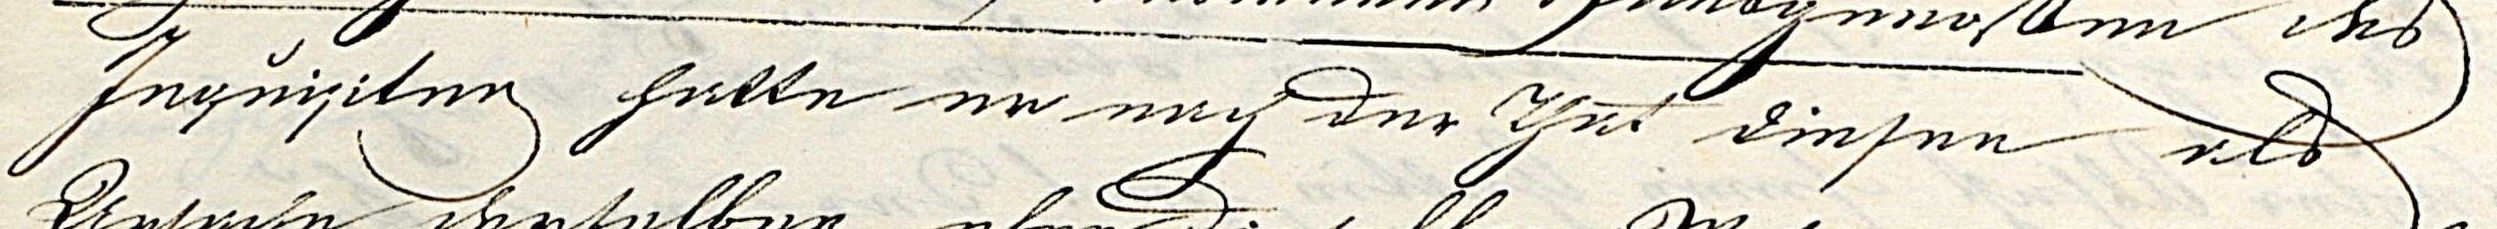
Inquisiten hatte er nach der That diesen als
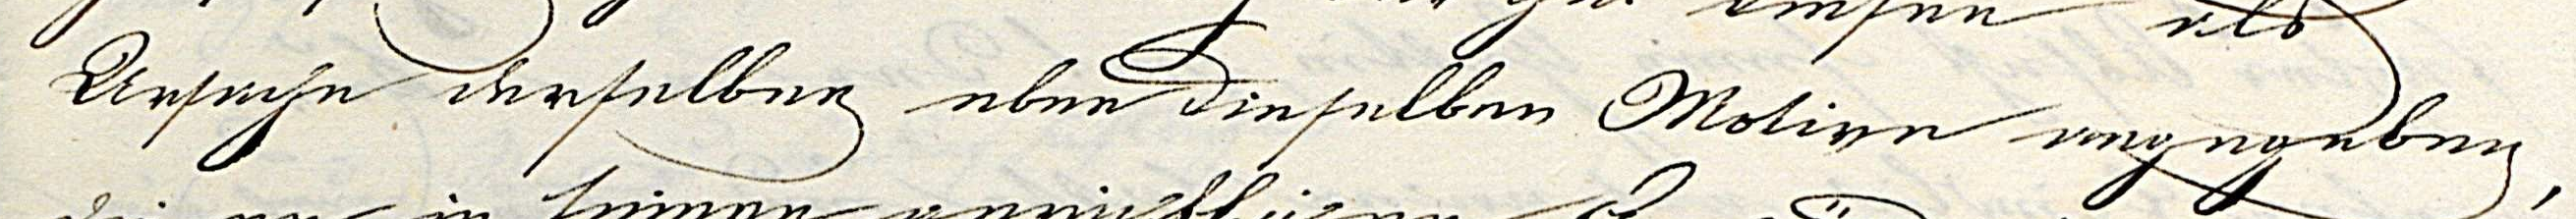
Ursache derselben eben dieselben Motive angegeben,
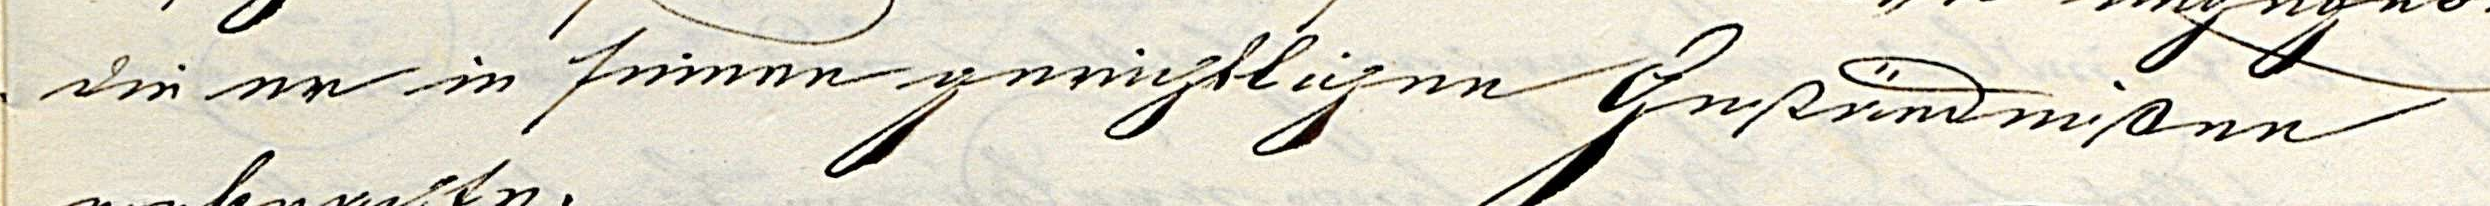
die er in seinen gerichtlichen Geständnißen
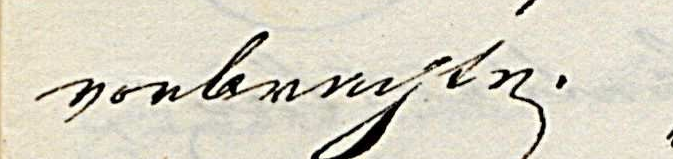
vorbrachte.
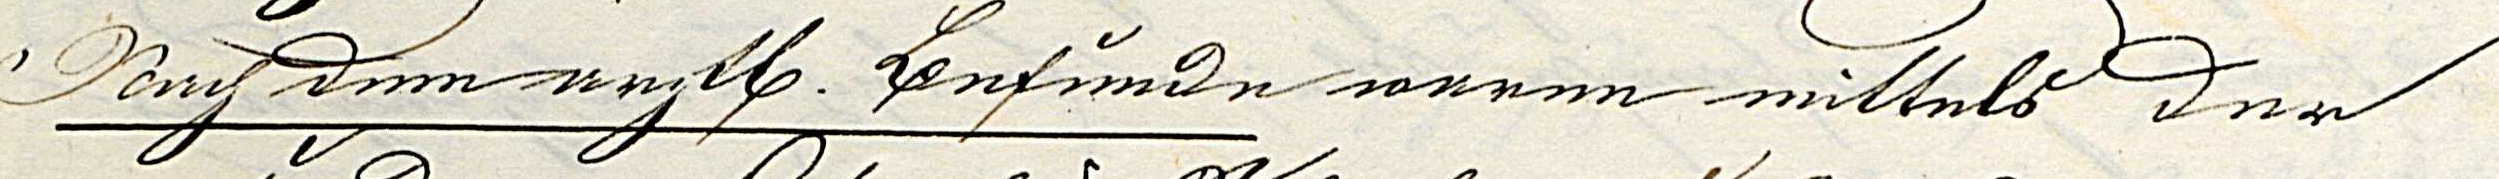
Nach dem ärztl. Befunde waren mittels der
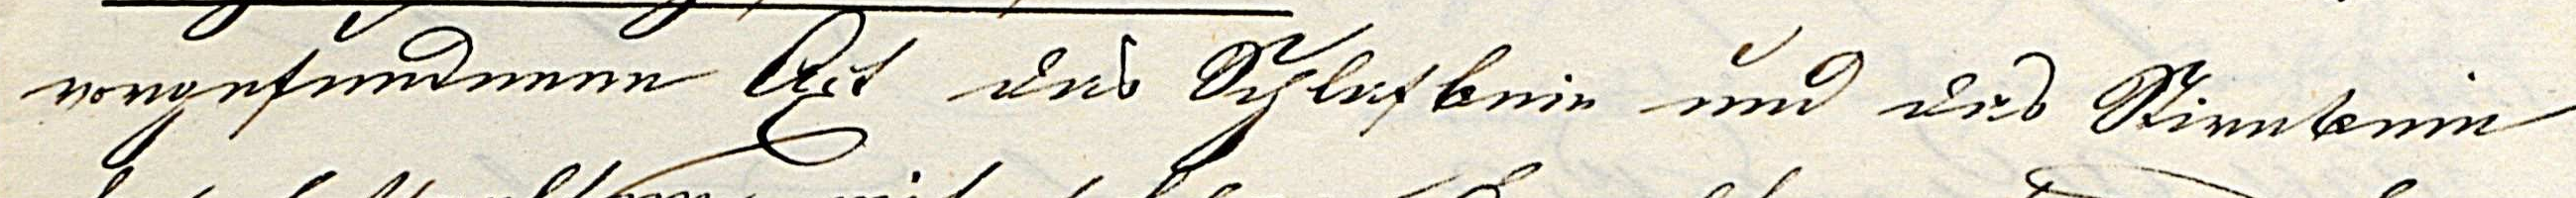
vorgefundenen Axt das Schlafbein und das Stirnbein
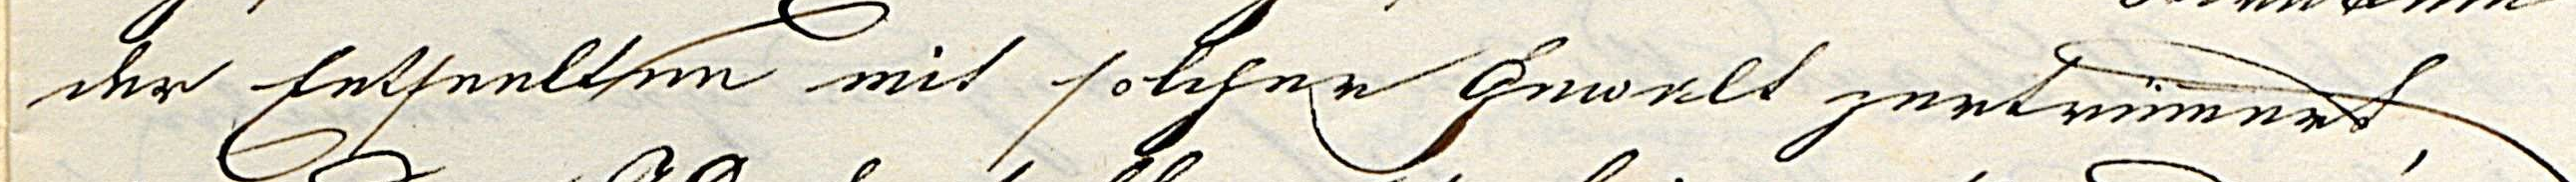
der Entseelten mit solcher Gewalt zertrümmert,
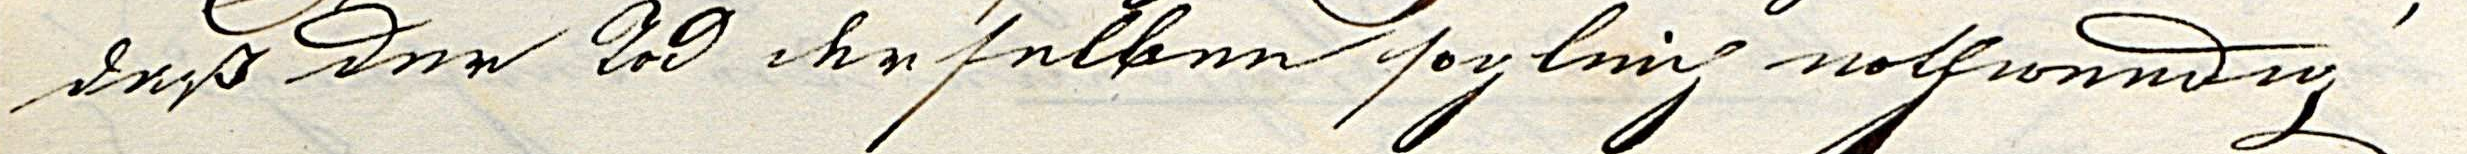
daß der Tod der selben sogleich nothwendig
